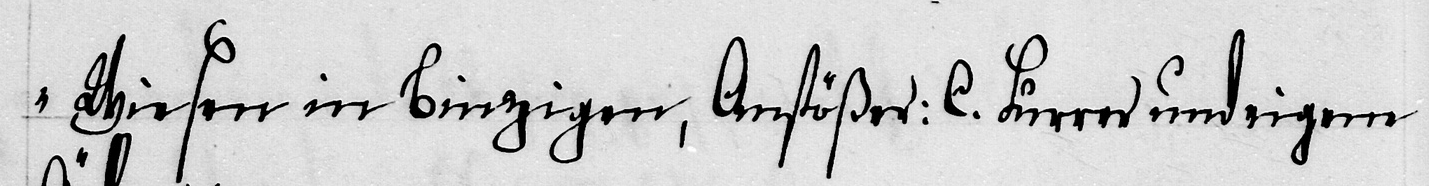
Wiesen in Binzigen, Anstößer: C. Furrer und eigene
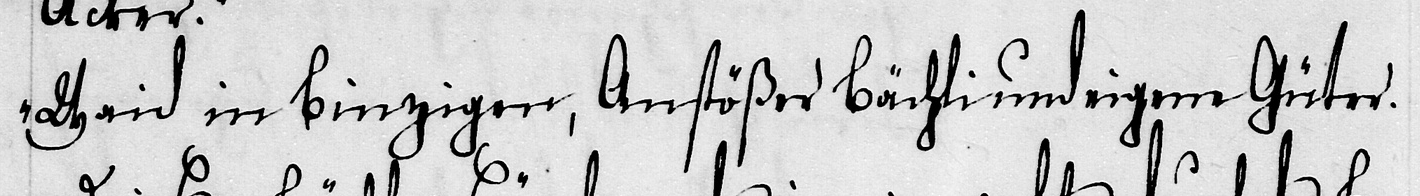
„Waid in Binzigen, Anstößer Bächli und eigene Güter.
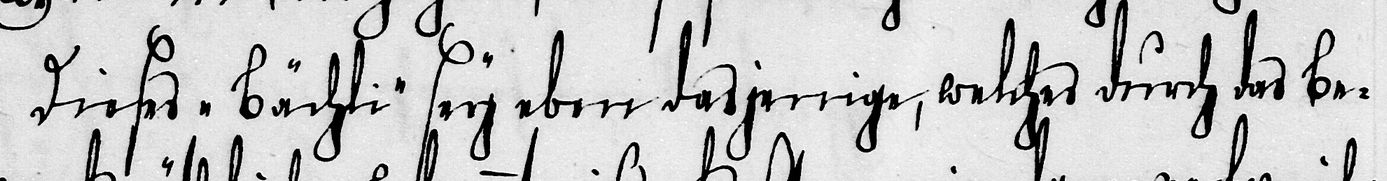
Dieses „Bächli“ sey eben dasjenige, welches durch das Be¬
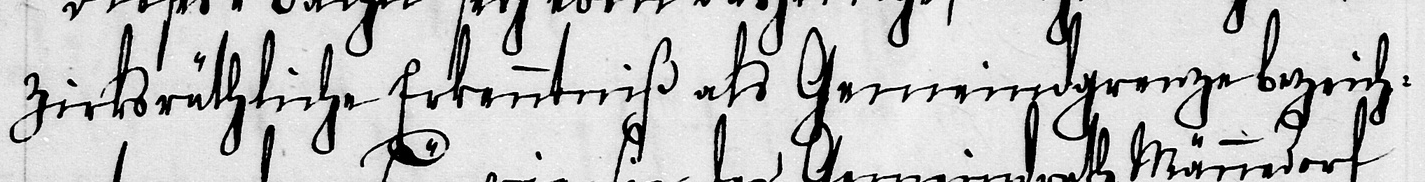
zirksräthliche Erkenntniß als Gemeindgrenze bezeich¬
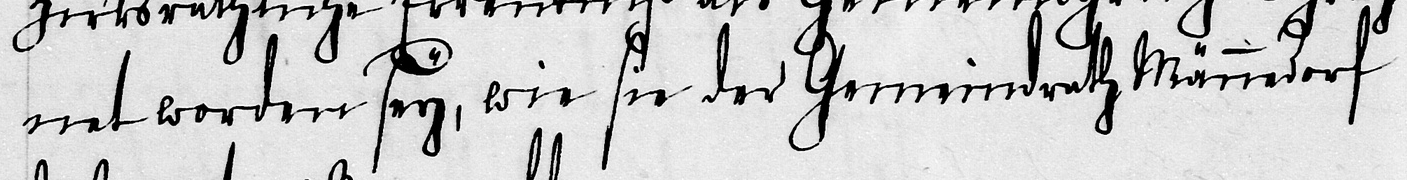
net worden sey, wie sie der Gemeindrath Männedorf
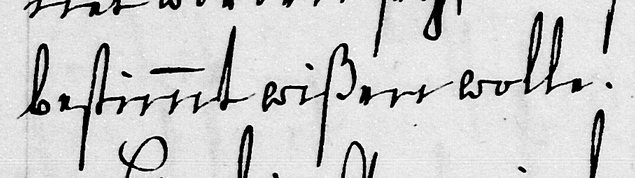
bestimmt wißen wolle.
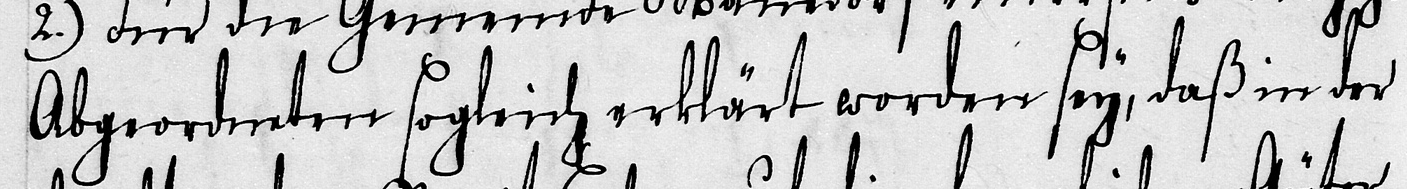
Abgeordneten sogleich erklärt worden sey, daß in der
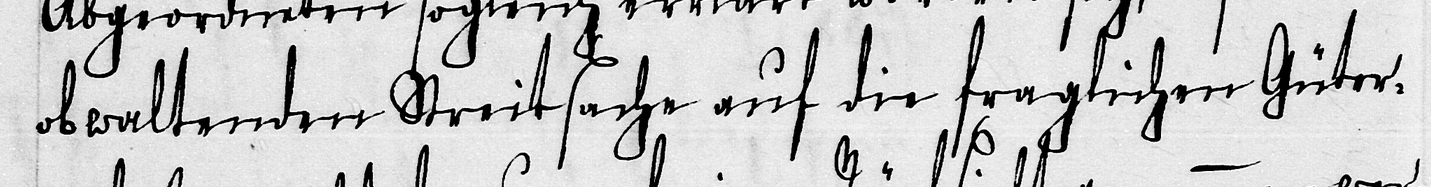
obwaltenden Streitsache auf die fraglichen Güte¬
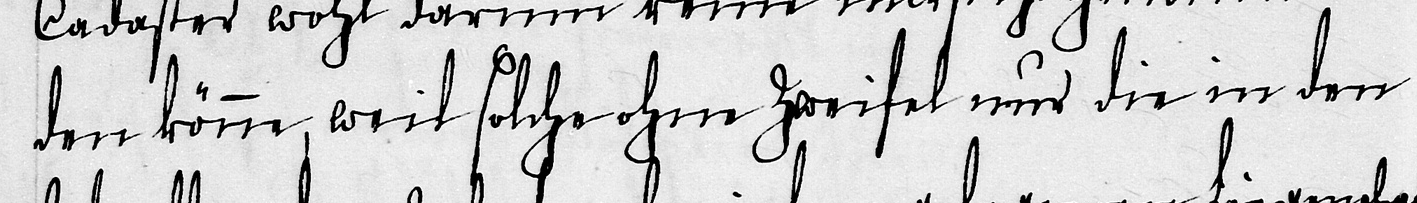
den könne, weil solche ohne Zweifel nur die in den
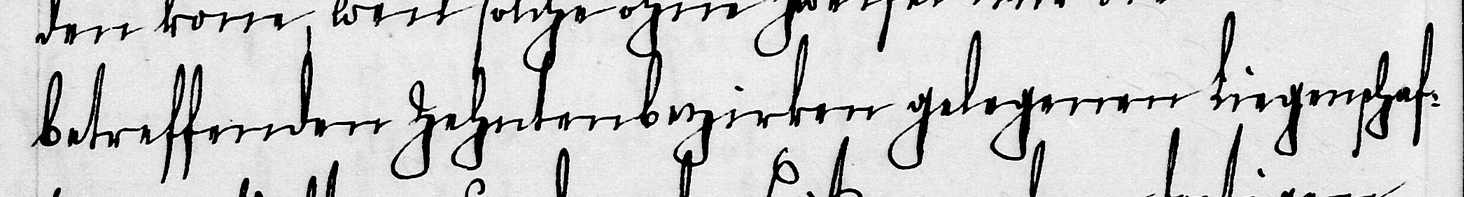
betreffenden Zehntenbezirken gelegenen Liegenschaf¬
